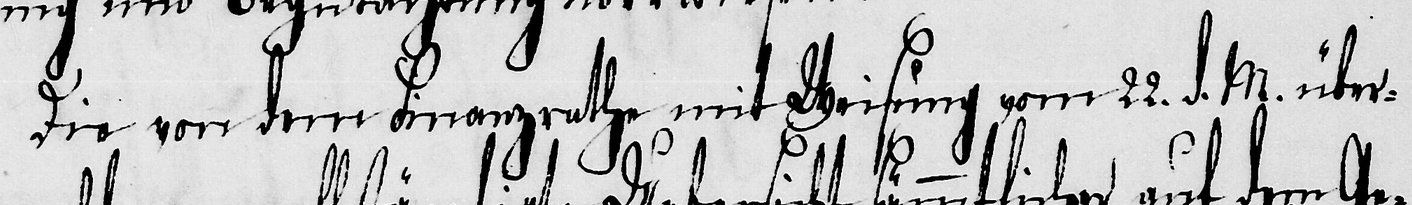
Die von dem Finanzrathe mit Weisung vom 22. d. M. über¬
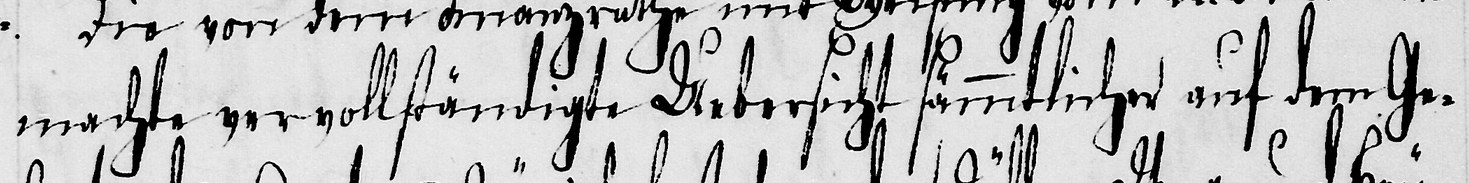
machte vervollständigte Uebersicht sämmtlicher auf dem Ge¬
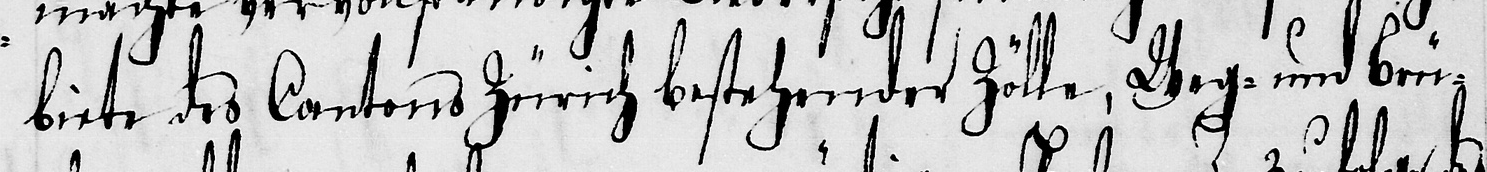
biete des Cantons Zürich bestehender Zölle, Weg- und Brü¬
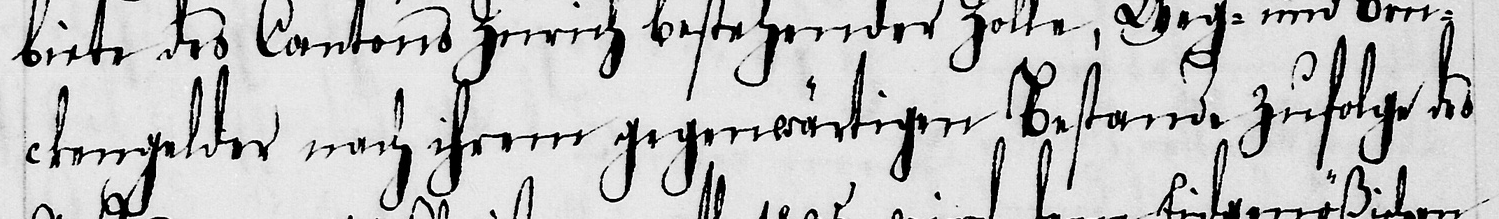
ckengelder nach ihrem gegenwärtigen Bestande zufolge des
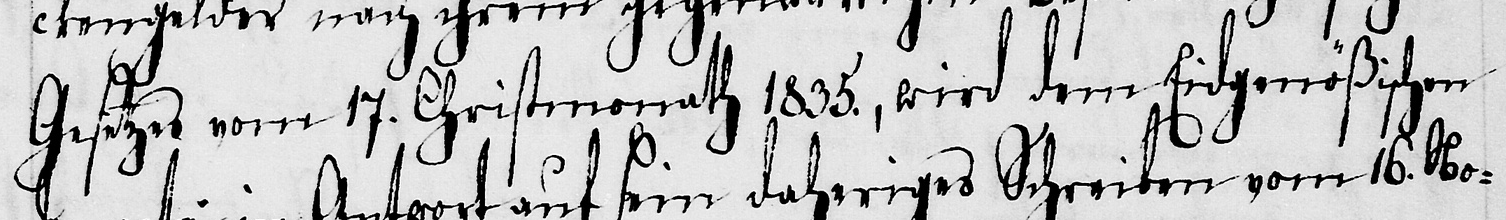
Gesetzes vom 17. Christmonath. 1835., wird dem Eidgenößischen
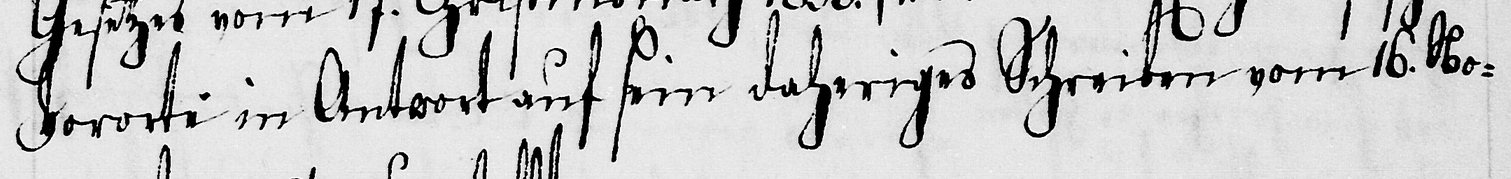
Vororte in Antwort auf sein daheriges Schreiben vom 16. No¬
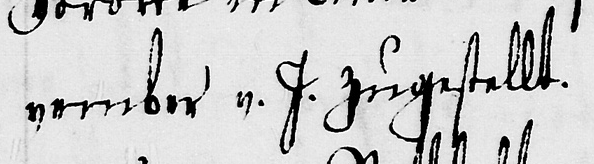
vember v. J. zugestellt.
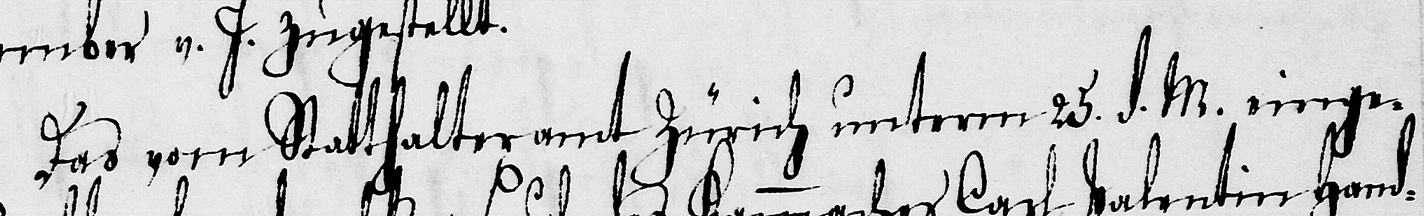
Das vom Statthalteramt Zürich unterm 25. d. M. einge¬
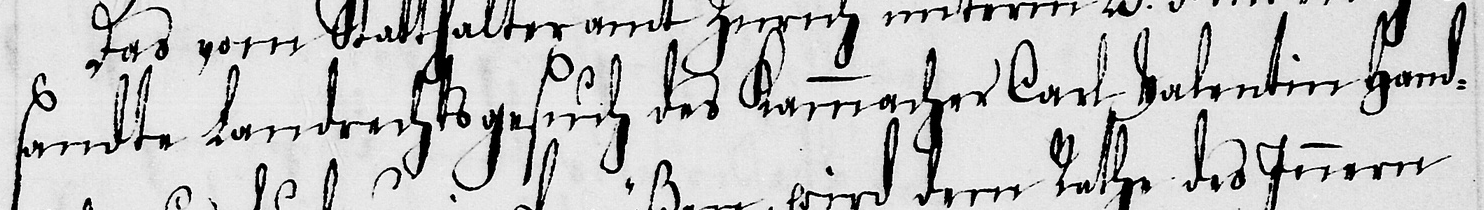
sandte Landrechtsgesuch des Kammacher Carl Valentin Hand¬
